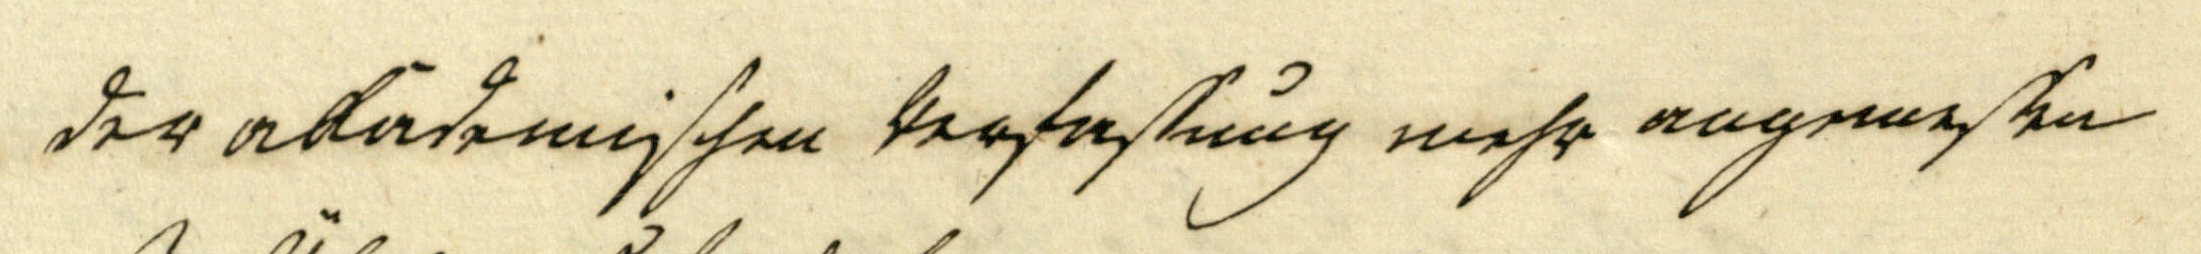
der akademischen Verfassung mehr angemessen
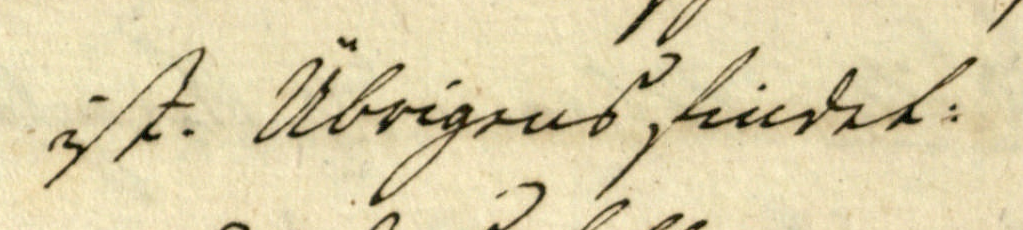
ist. Übrigens findet:
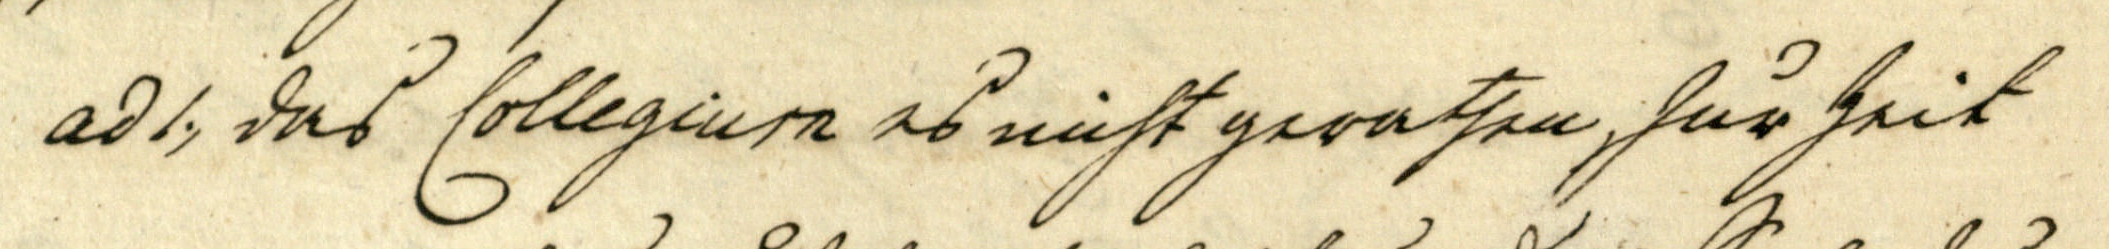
ad 1., das Collegium es nicht gerathen, zur Zeit
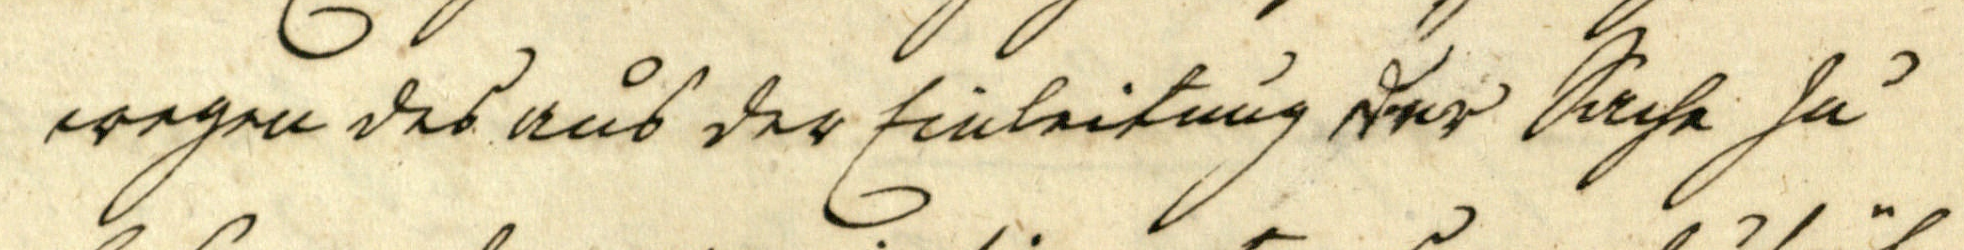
wegen des aus der Einleitung der Sache zu
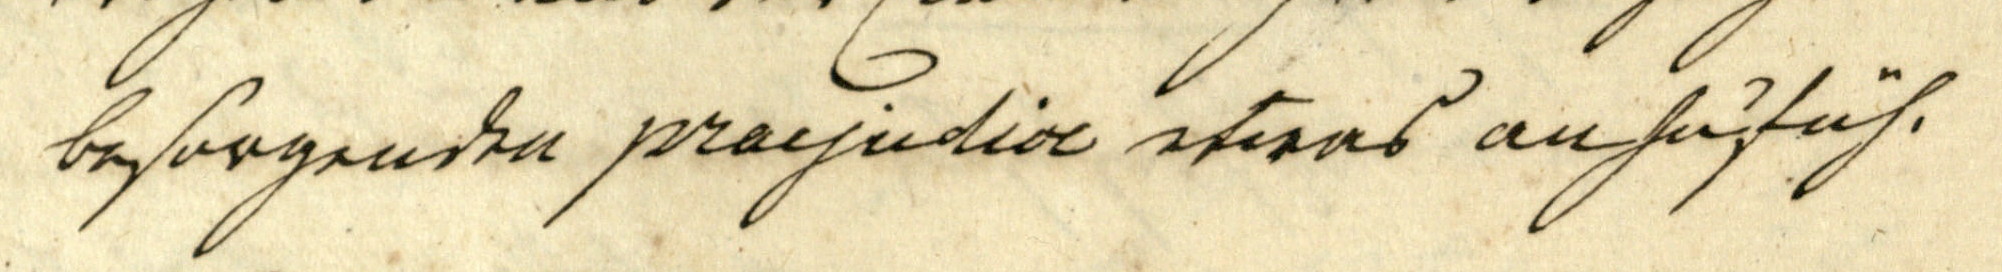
besorgenden praejudice etwas anzufüh¬
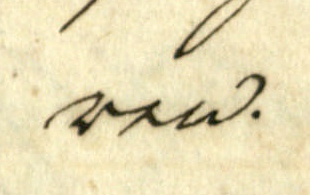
ren.
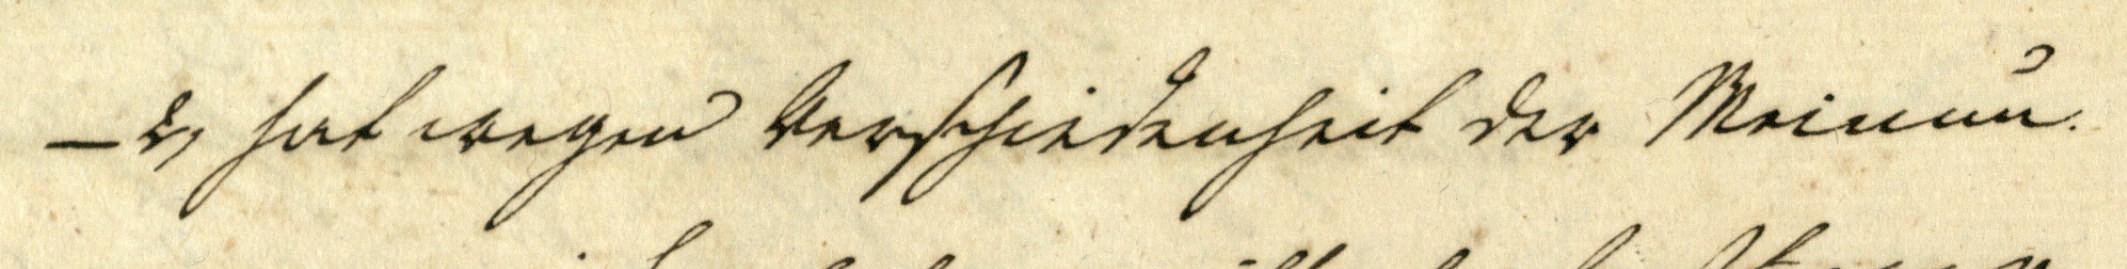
2. hat wegen Verschiedenheit der Meinun¬
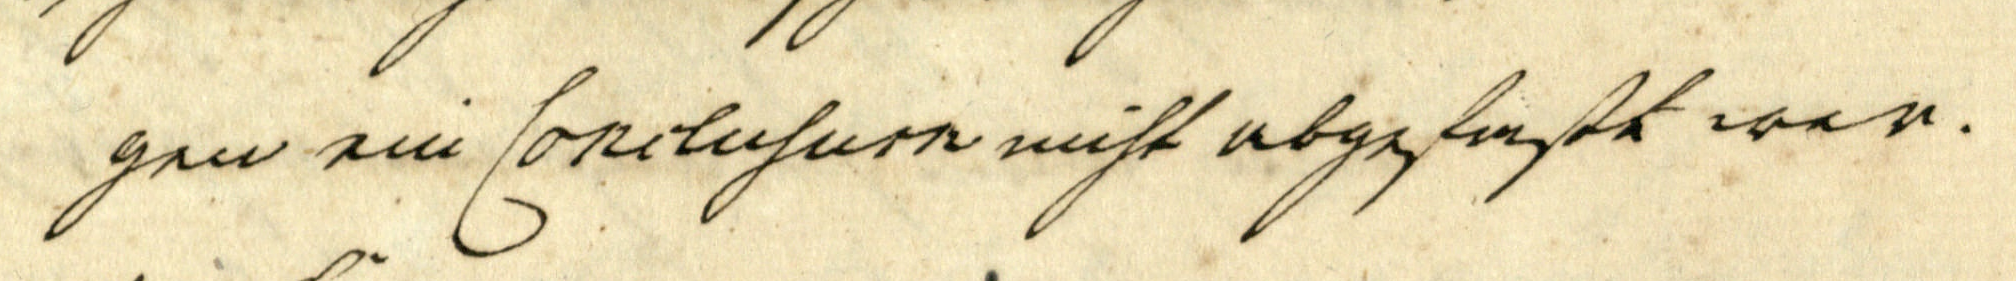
gen ein Conclusum nicht abgefaßt wer-
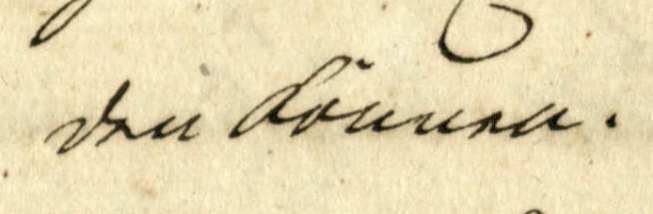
den können.
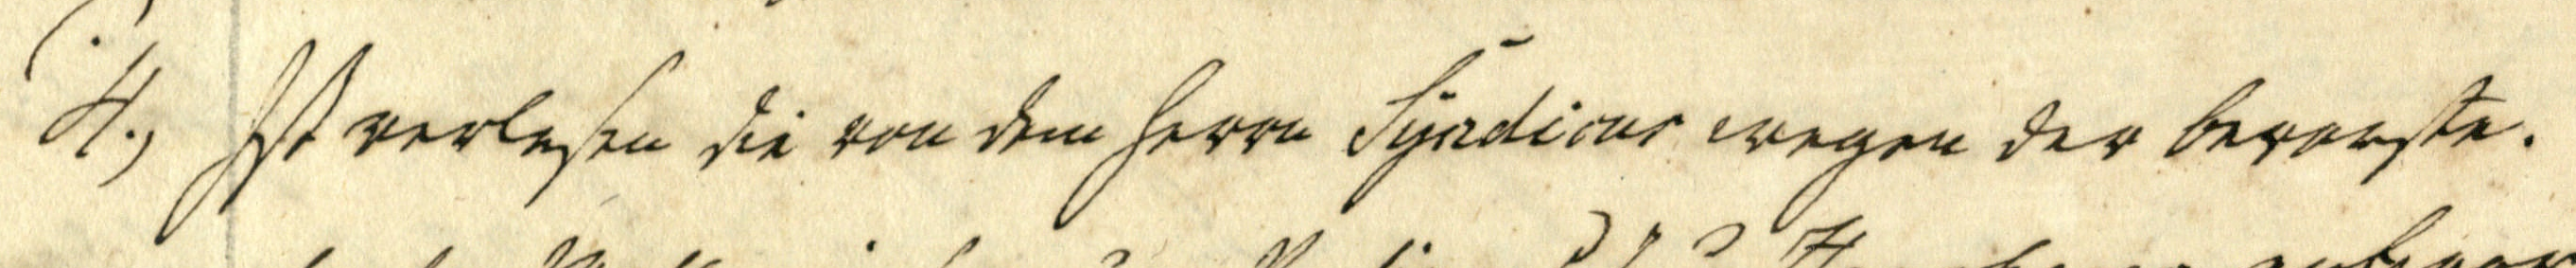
4., Ist verlesen die von dem herrn Sÿndicus wegen der bevorste¬
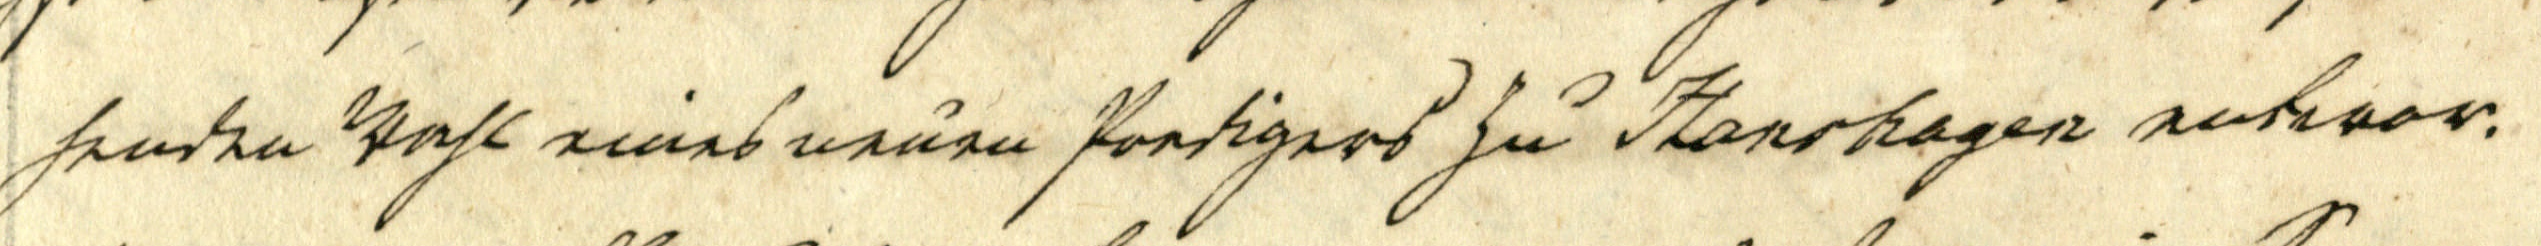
henden Wahl eines neuen Predigers zu Hanshagen entwor¬
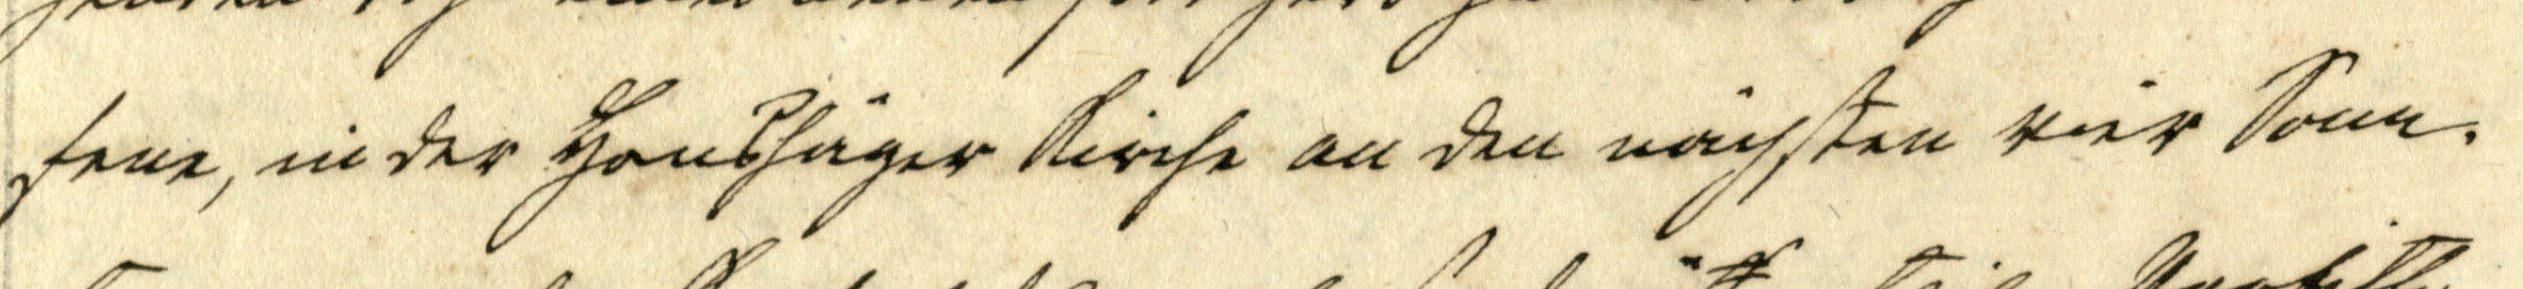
fene, in der Hanshäger Kirche an den nächsten vier Sonn¬
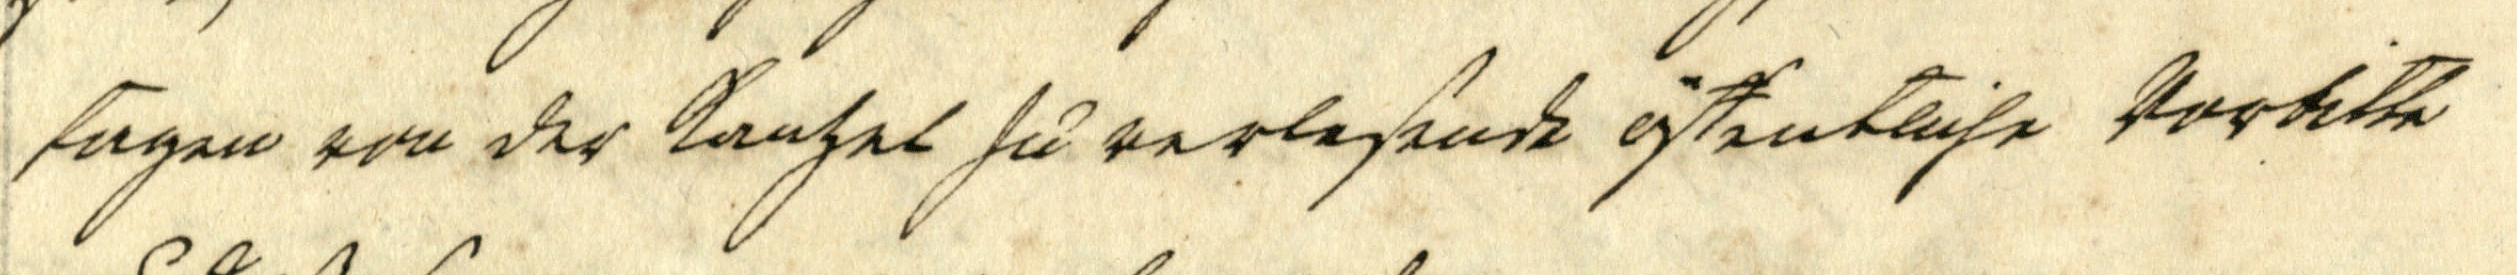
tagen von der Kanzel zu verlesende öffentliche Vorbitte
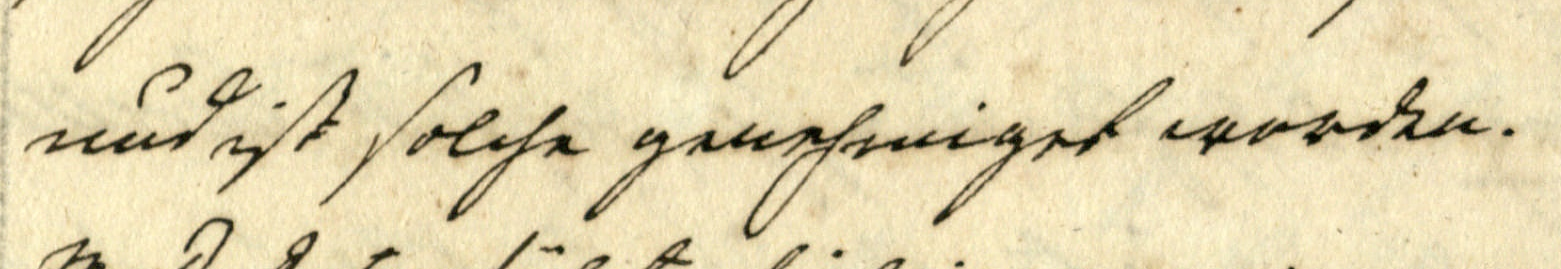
und ist solche genehmiget worden.
